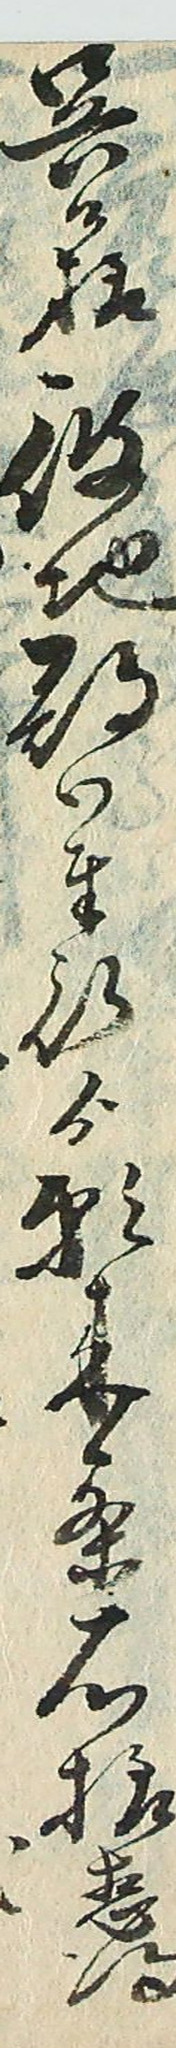呉候様彼地郡御奉行ゟ頼来候条右様相心得
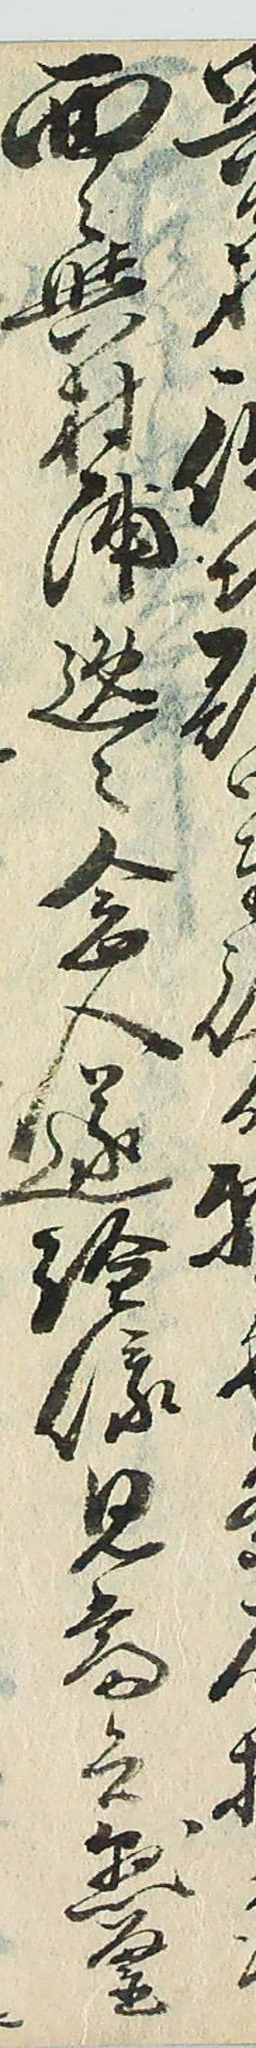面々与村浦逸々念入遂詮儀見当候はゝ懸留置
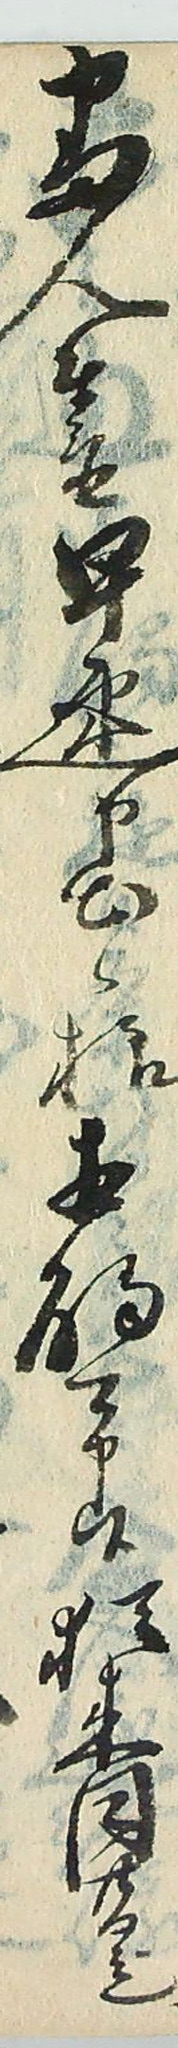番人付置早速申出候様相触可申候猶来月廿日迄に
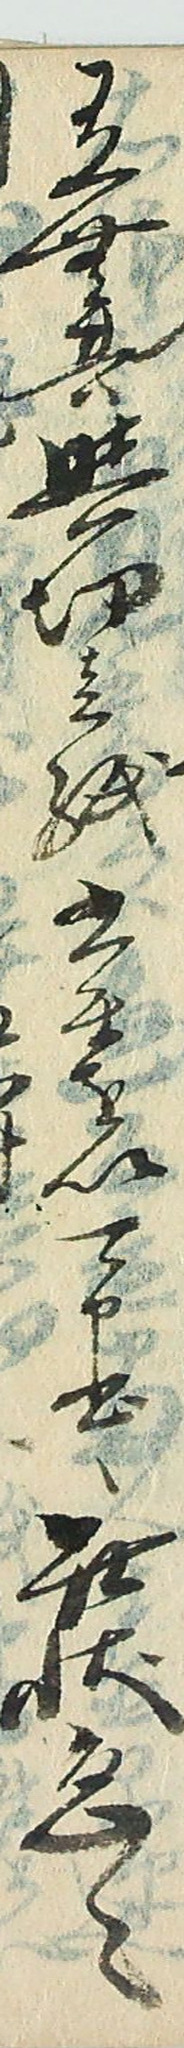有無共与切壱紙書付を以可申出候此状急々
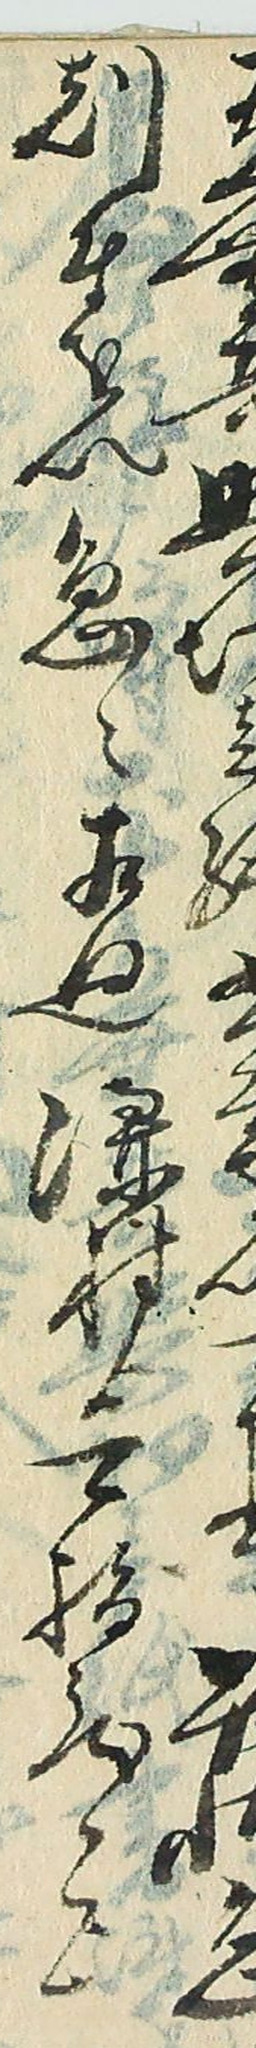刻付を以急々相廻済村ゟ可指戻候以上
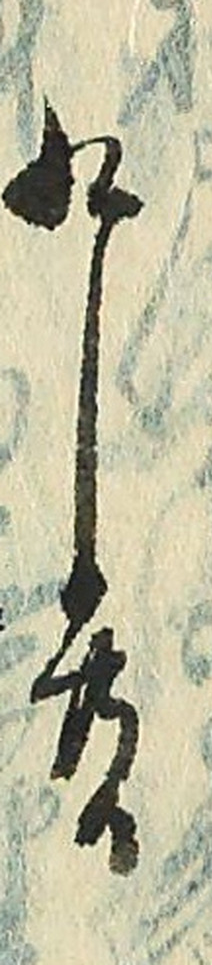九月廿日
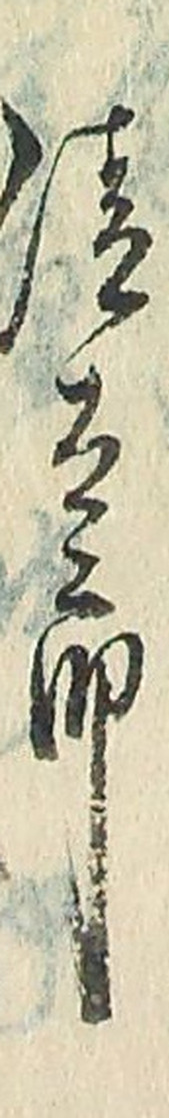清太郎
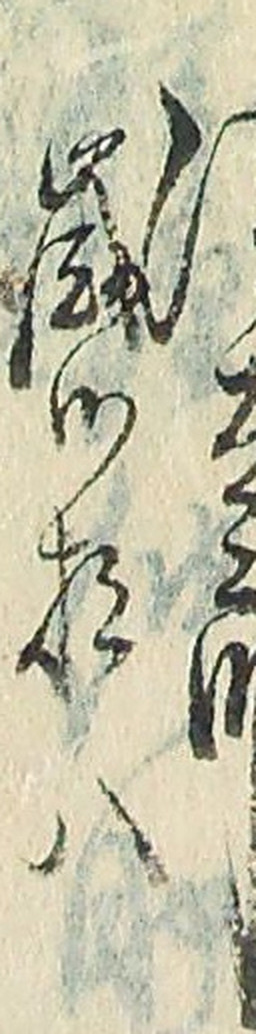歳弐拾八
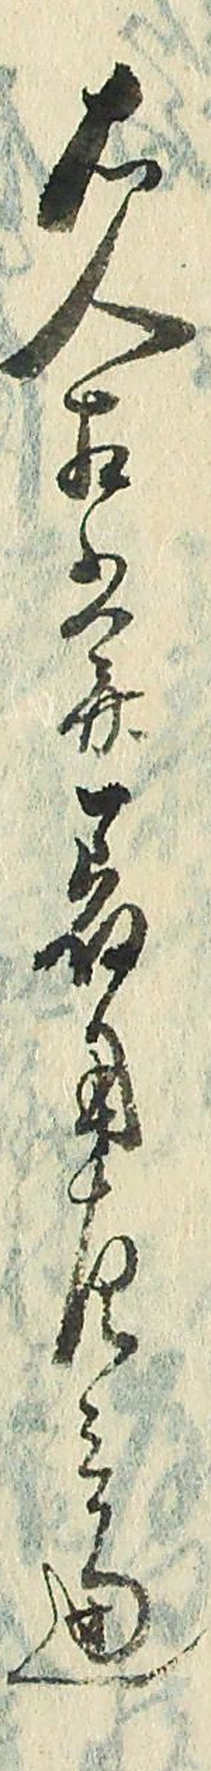右人相書幷着用左之通
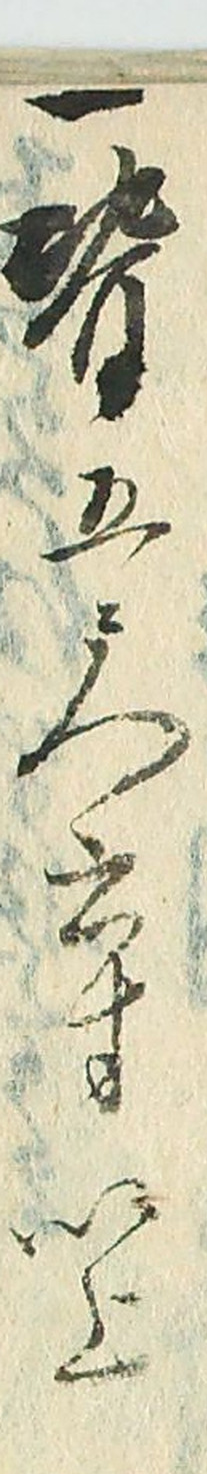一背五尺六寸以上
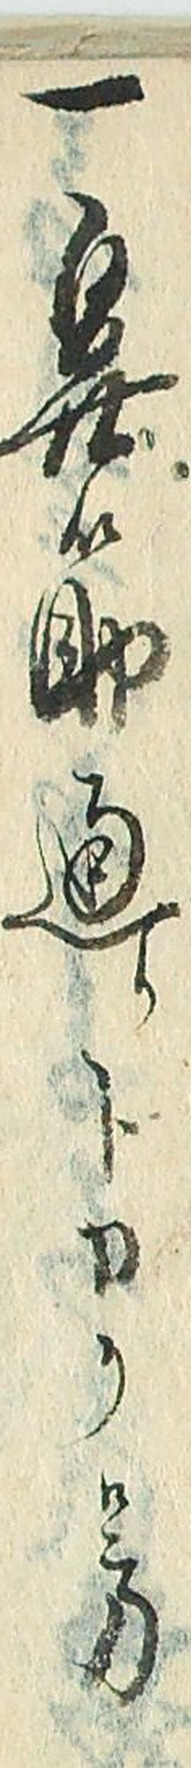一鼻筋通りトカリ候方
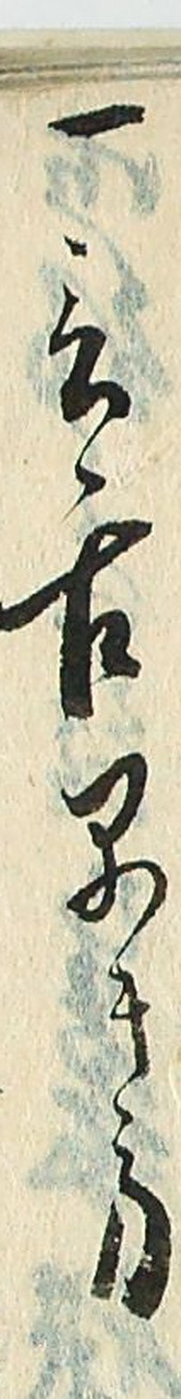一言舌早き方
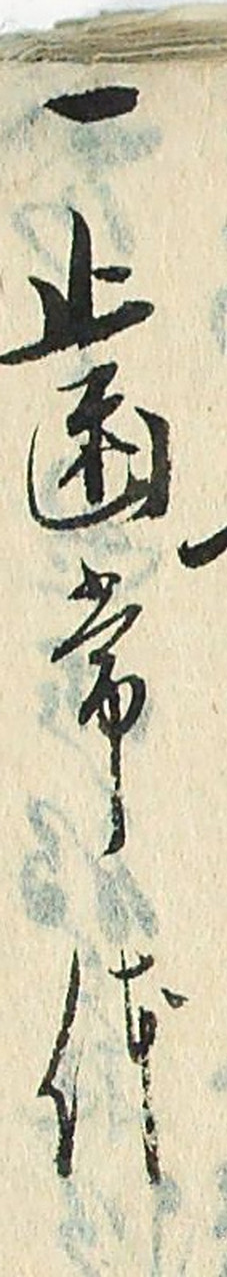一歯常体

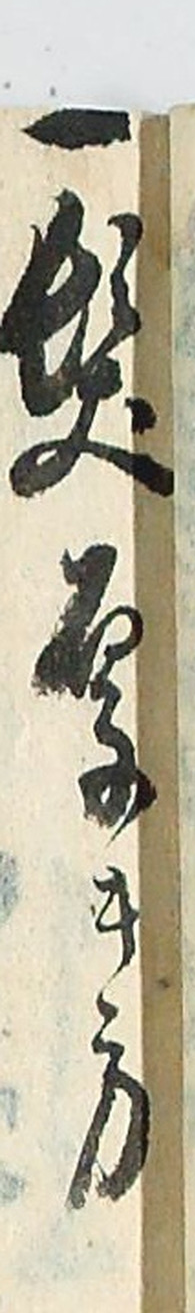一髪厚キ方
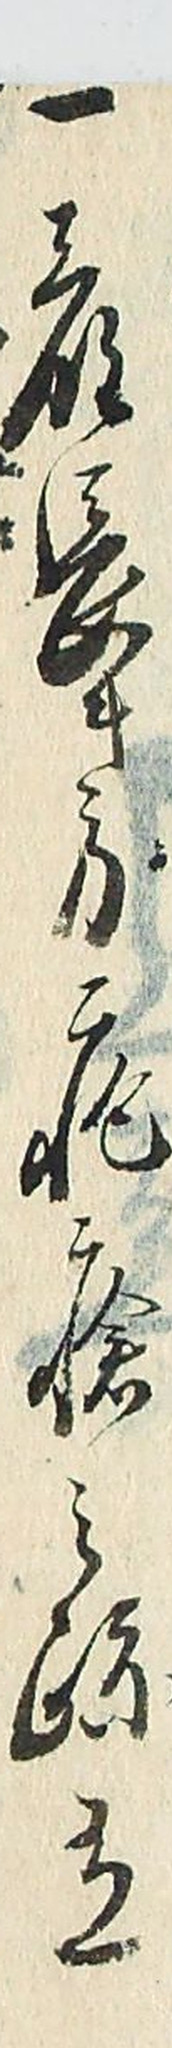一顔長キ方疱瘡之跡有
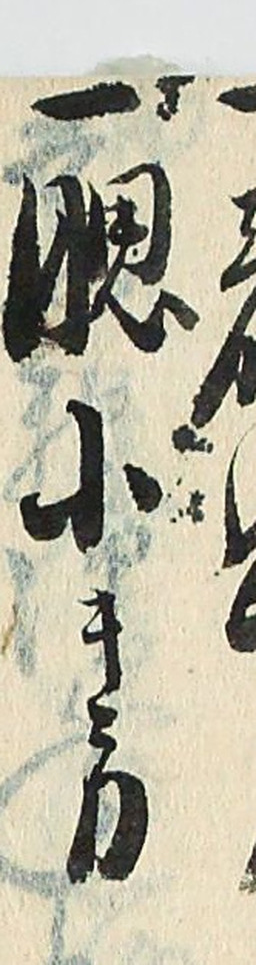一腮小キ方
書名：諸御用御□受書控
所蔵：鳴門教育大学 Naruto University of Education
